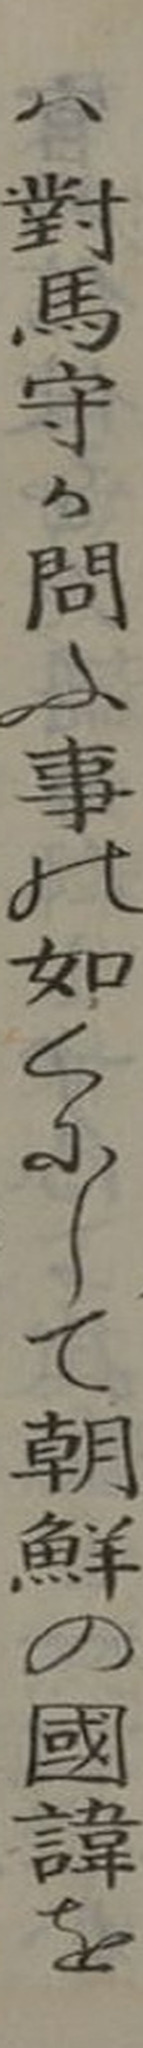は對馬守か問ふ事の如くにして朝鮮の國諱を
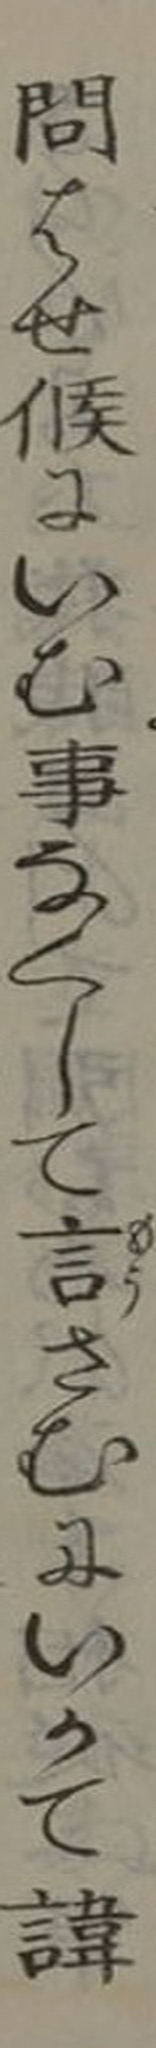問はせ候にいむ事なくして言さむにいかて諱
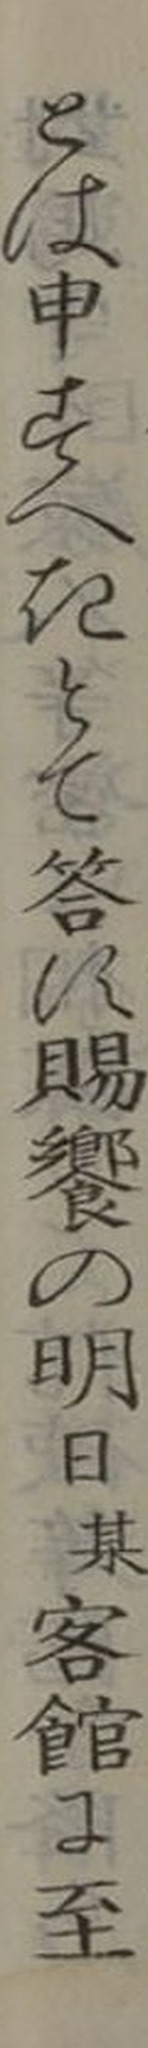とは申すへきとて答す賜饗の明日某客館に至
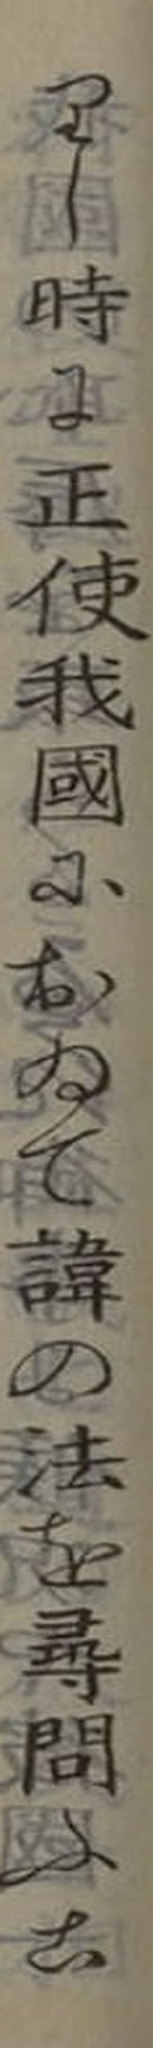りし時に正使我國におゐて諱の法を尋問ふこ
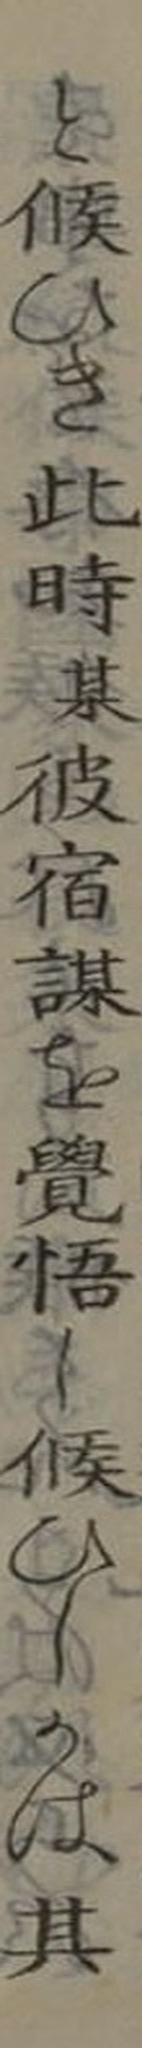と候ひき此時某彼宿謀を覺悟し候ひしかは其
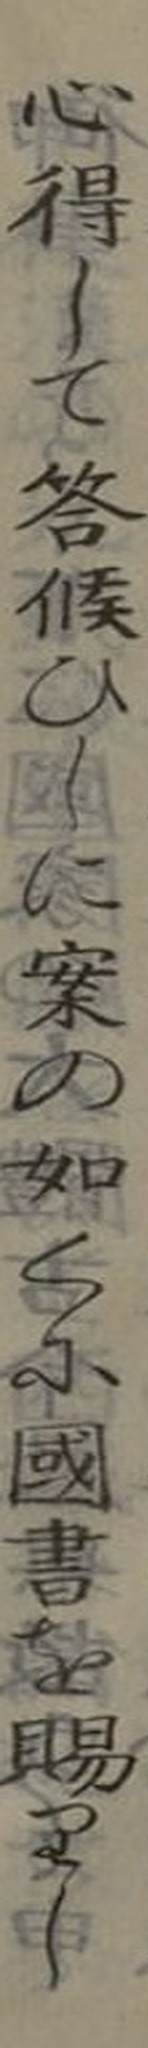心得して答候ひしに案の如くに國書を賜りし
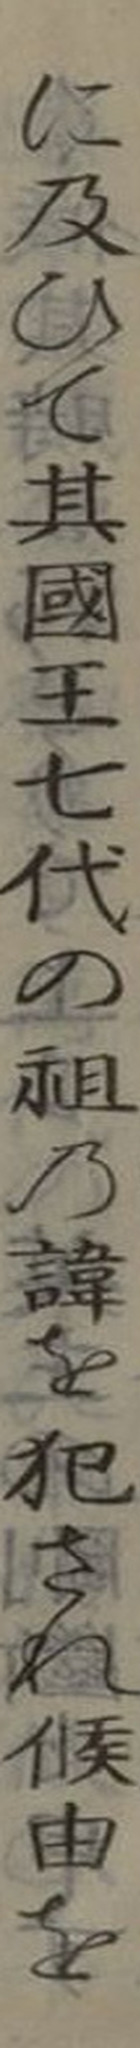に及ひて其國王七代の祖の諱を犯され候由を
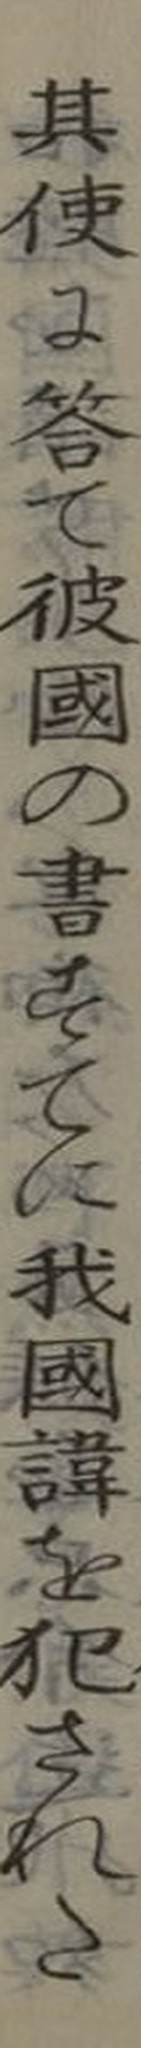其使に答て彼國の書すてに我國諱を犯された
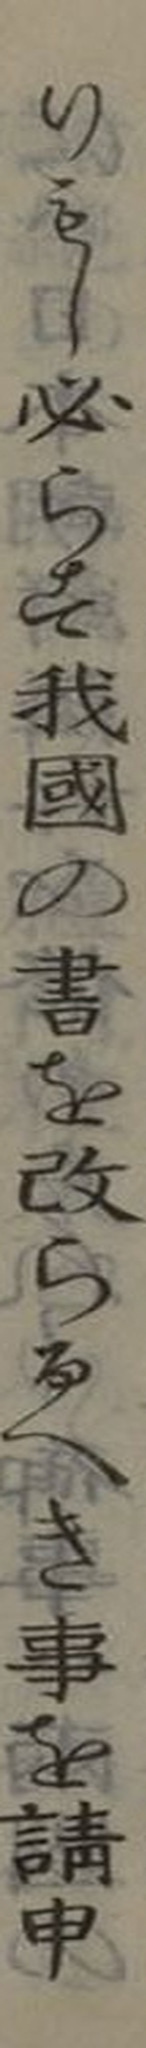りもし必らす我國の書を改らるへき事を請申
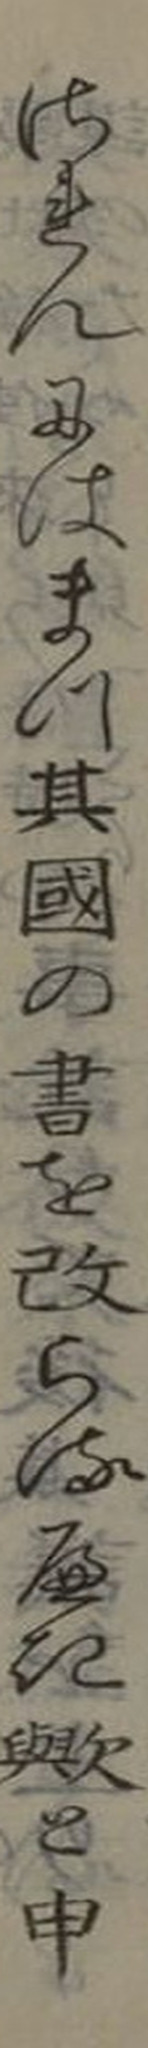されんにはまつ其國の書を改らるへきかと申
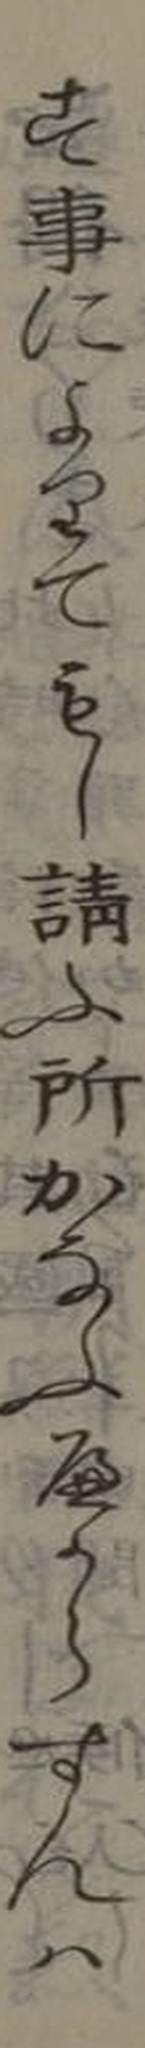す事によりてもし請ふ所かなふへからすんは
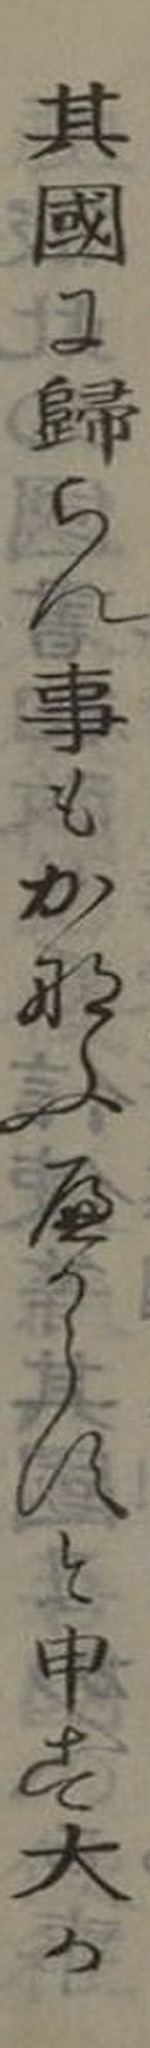其國に歸らん事もかなふへからすと申す大か
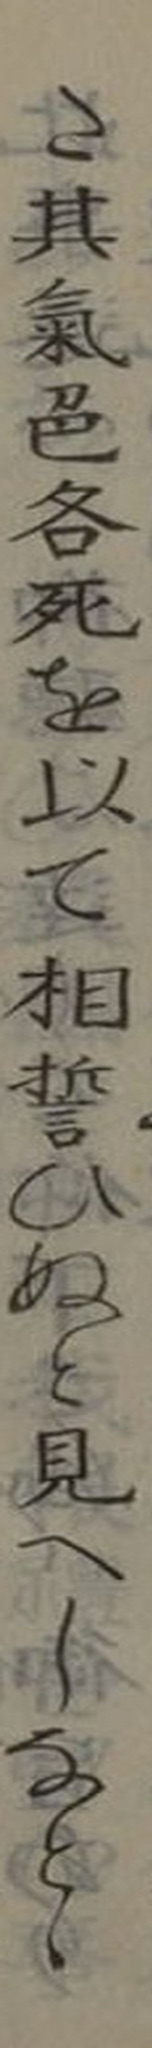た其氣色各死を以て相誓ひぬと見へしなとゝ
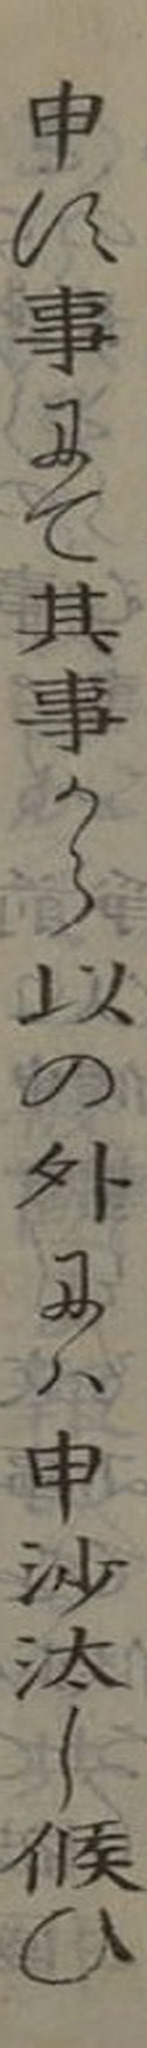申す事にて其事から以の外には申沙汰し候ひ

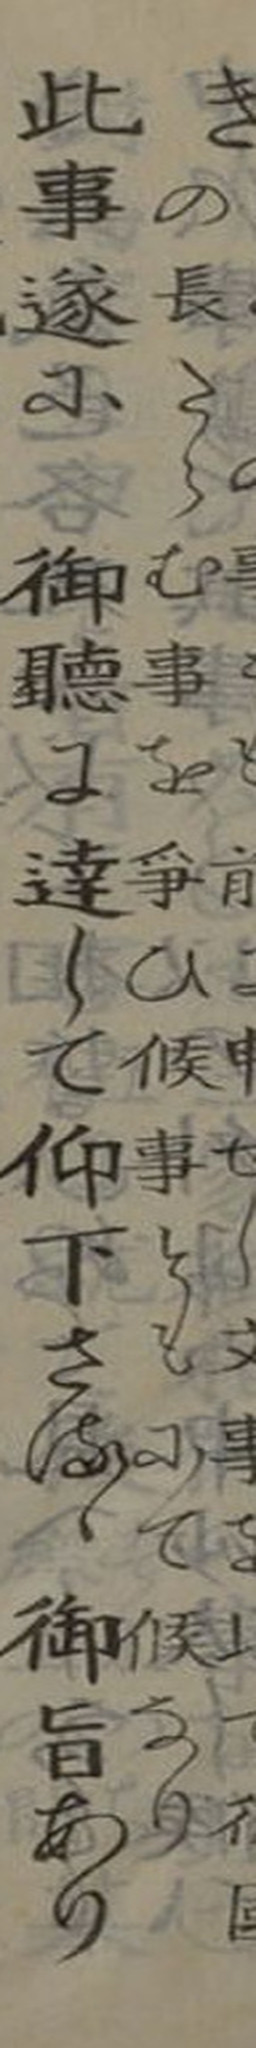此事遂に御聴に達して仰下さるゝ御旨あり
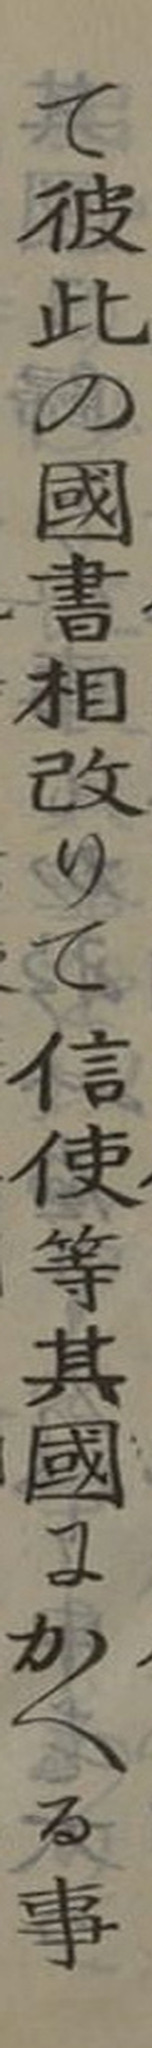て彼此の國書相改りて信使等其國にかへる事
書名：骨董録
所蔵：University of the Ryukyus Library
